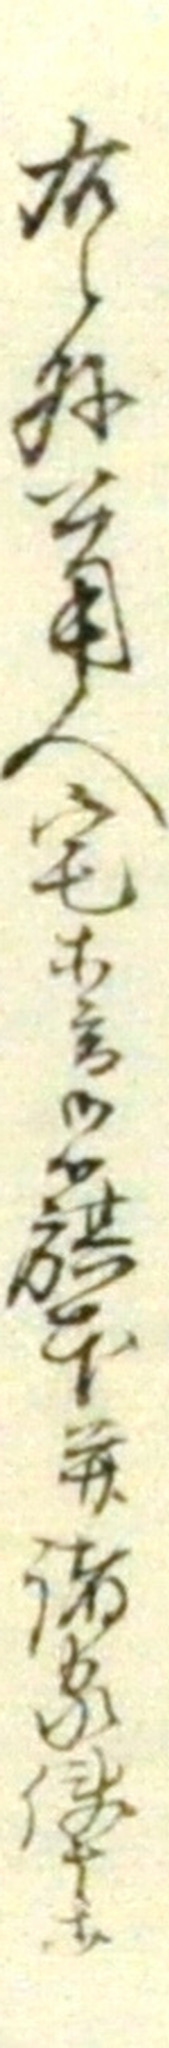右之外公用人宅等ニ而御旗本並諸家使者等
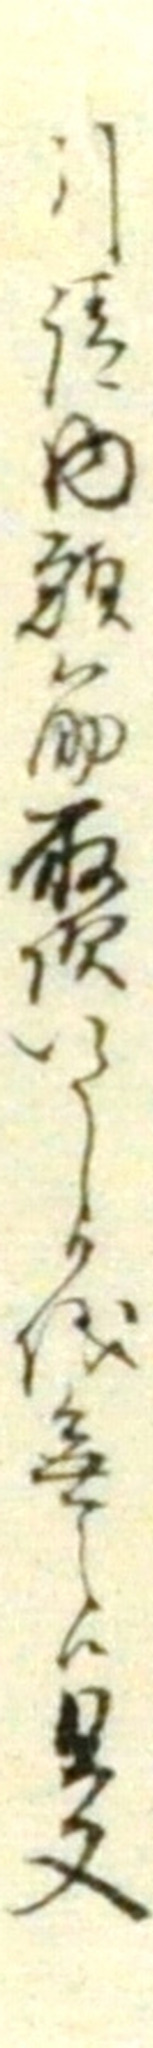引請内願筋取次いたし候儀無之候且又
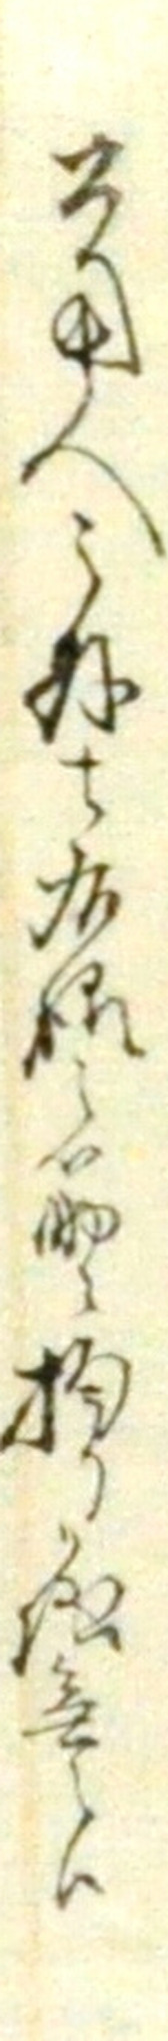公用人之外者右様之筋ニ拘り候儀無之候

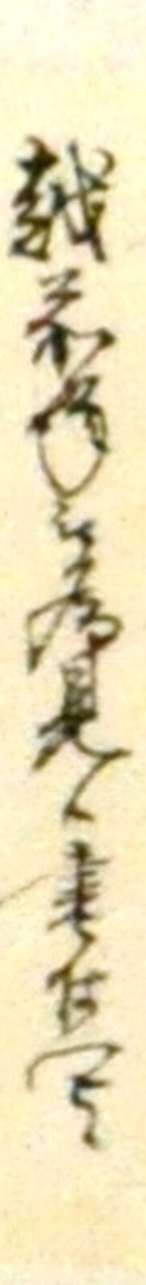越前殿被為見候書付写
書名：越前殿被為見候書付写
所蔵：伊那市立高遠町図書館・合同会社AMANE
